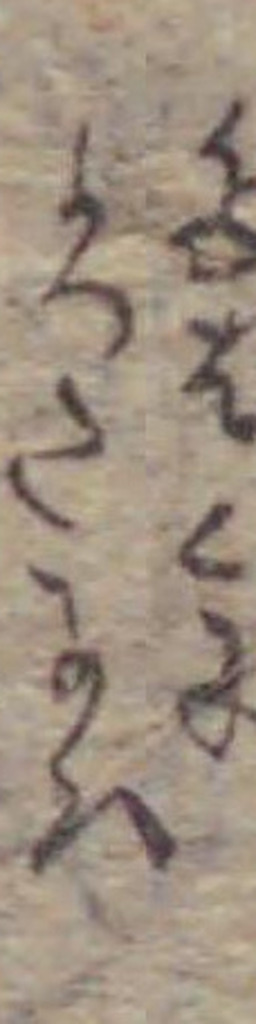よつたには
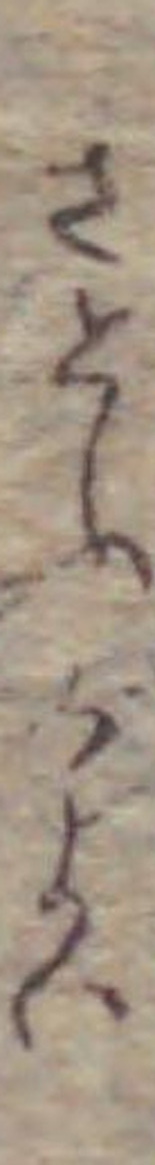さとふがよい
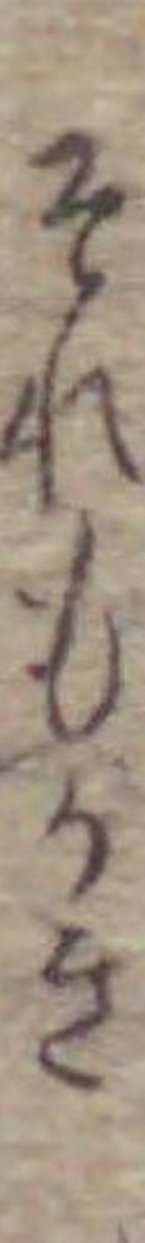それもかき
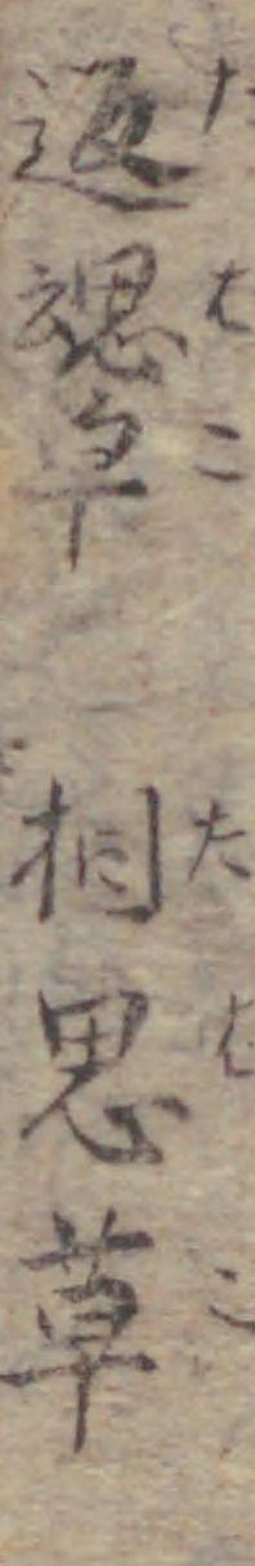返魂草相思草
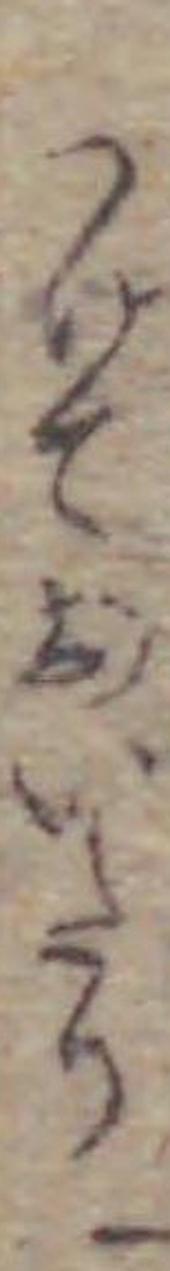つけておいたり
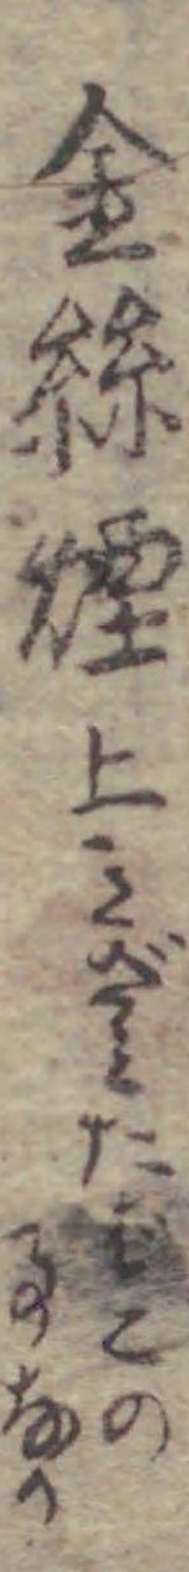金絲煙上きざみたばこの
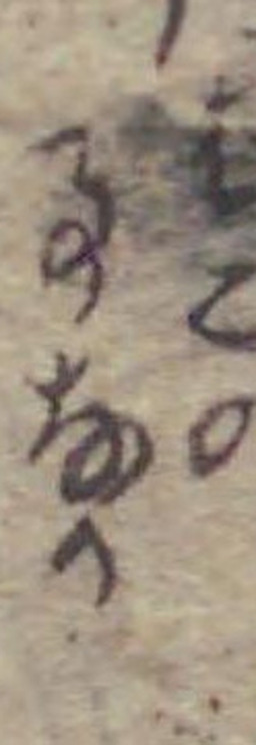事なり
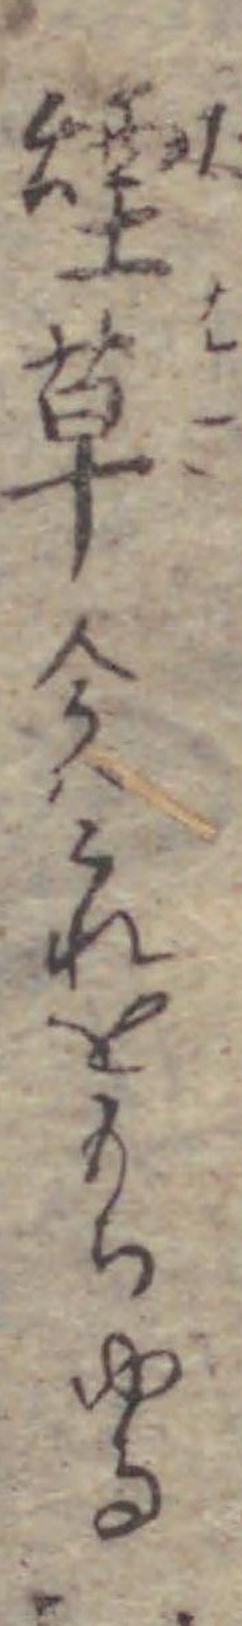煙草今はこれをもちちゆる
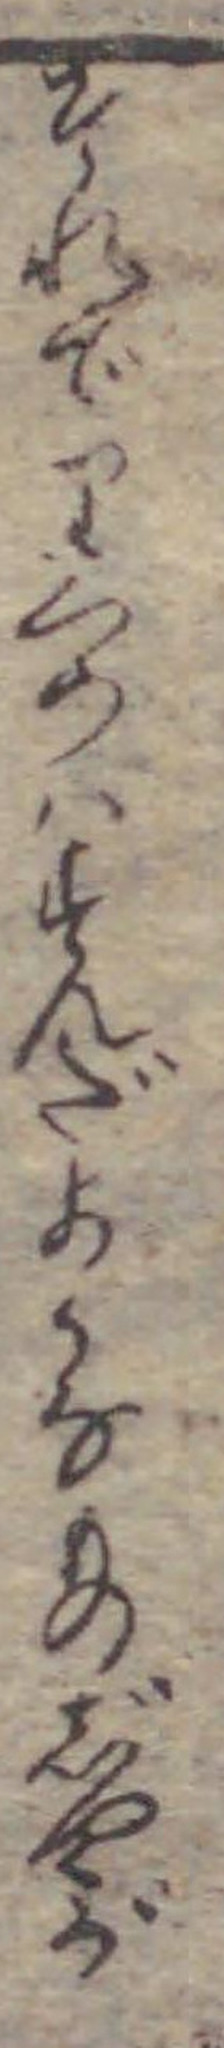それでりくつはすんだようなものじやが
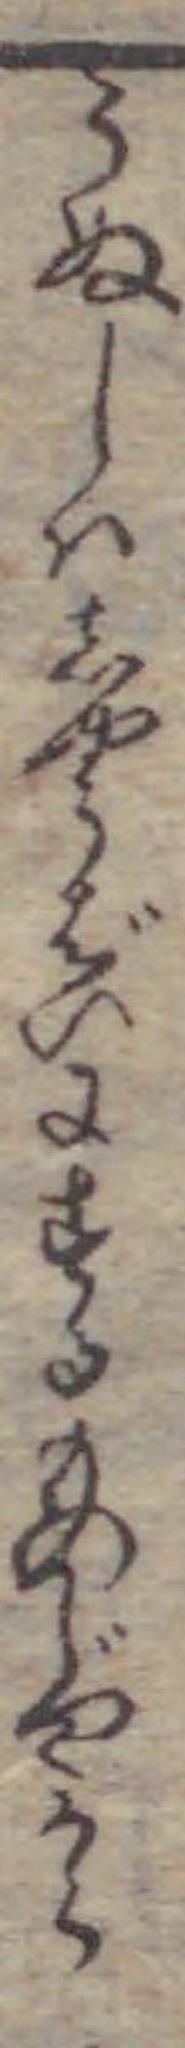うぬしはしやうばいにするものじやから
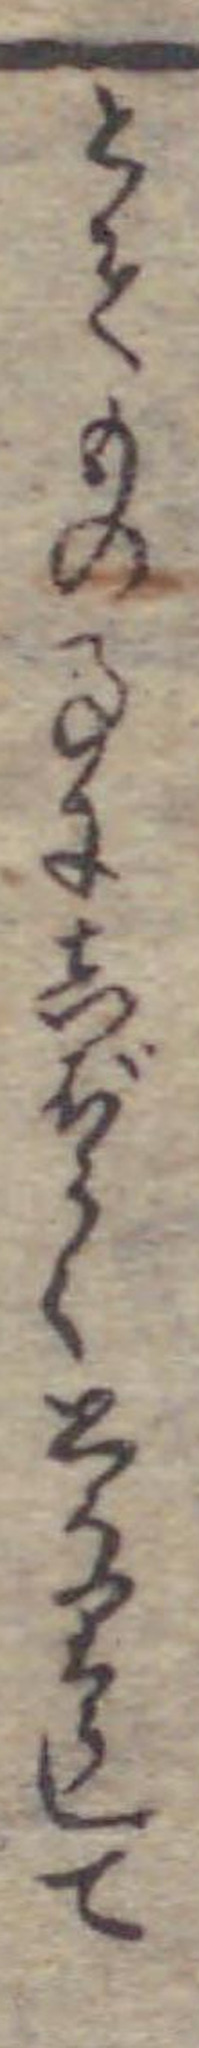とてもの事にしぢうくとうりうして
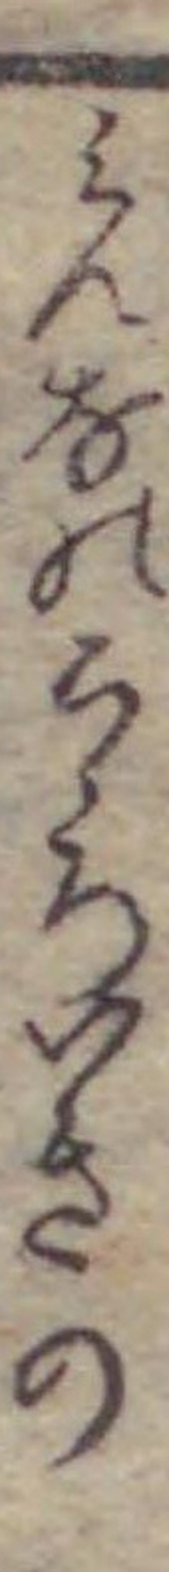みんなのこゝろはさの
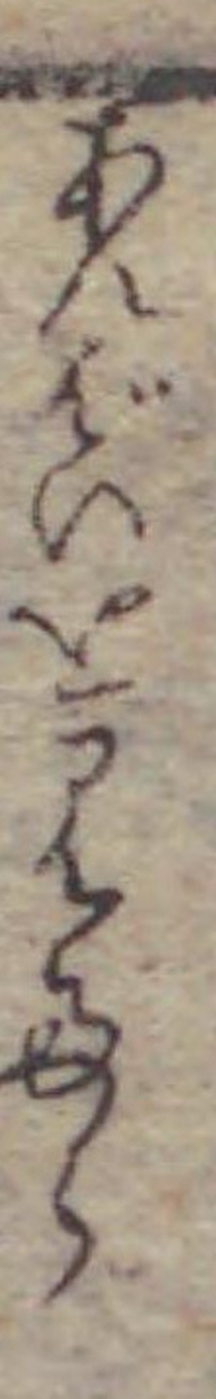あんばいをみたら
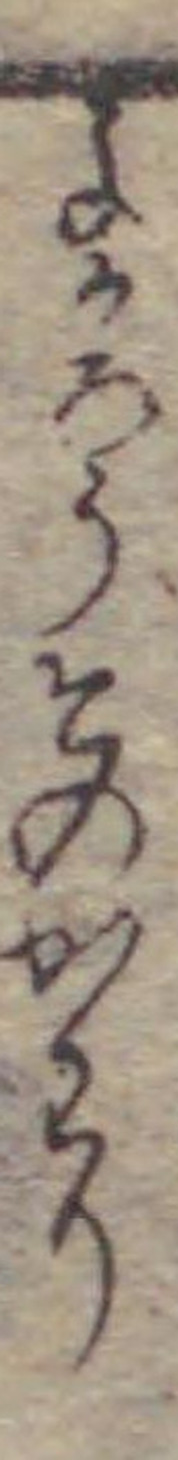よかろうそのかわり
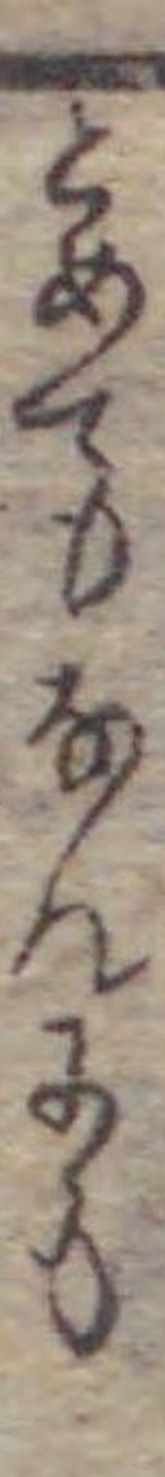とめてもなんにも
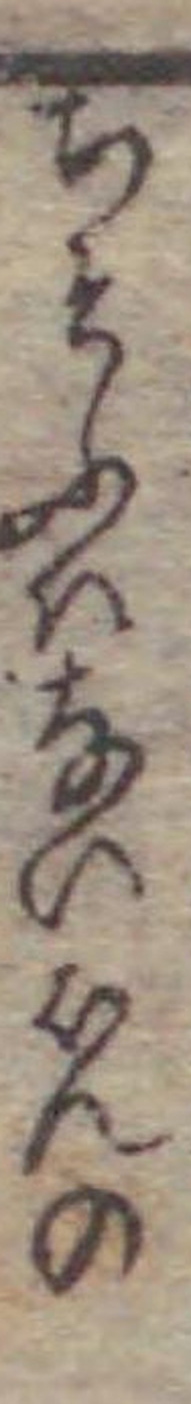ちそふはないけんの
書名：談芭菰誉詞 : 3巻
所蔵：国立国会図書館 National Diet Library, JAPAN
